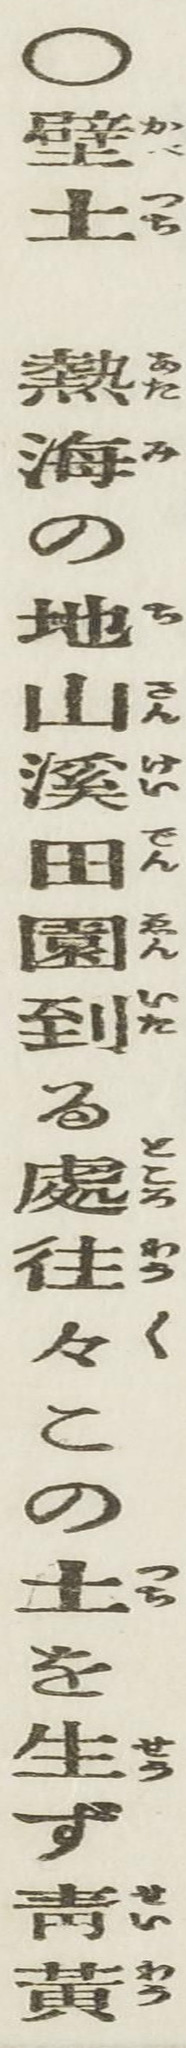○壁土熱海の地山溪田園到る処往々この土を生ず青黄
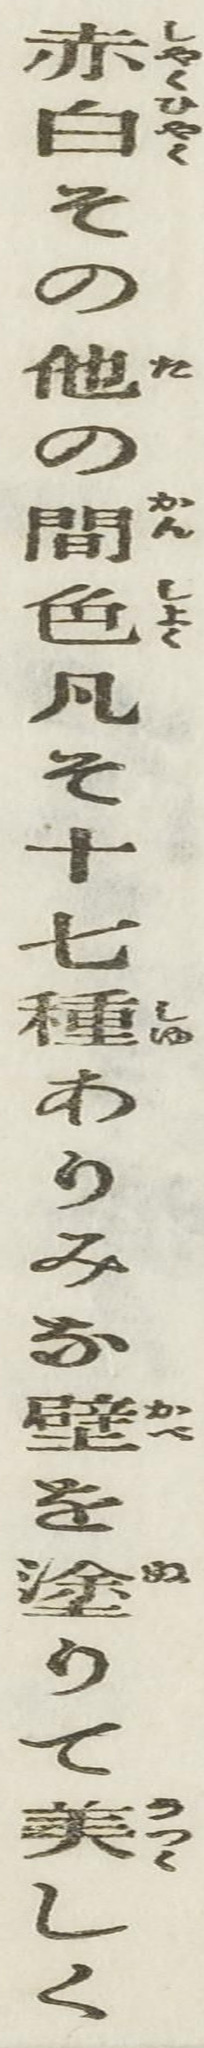赤白その他の間色凡そ十七種ありみな壁を塗りて美しく
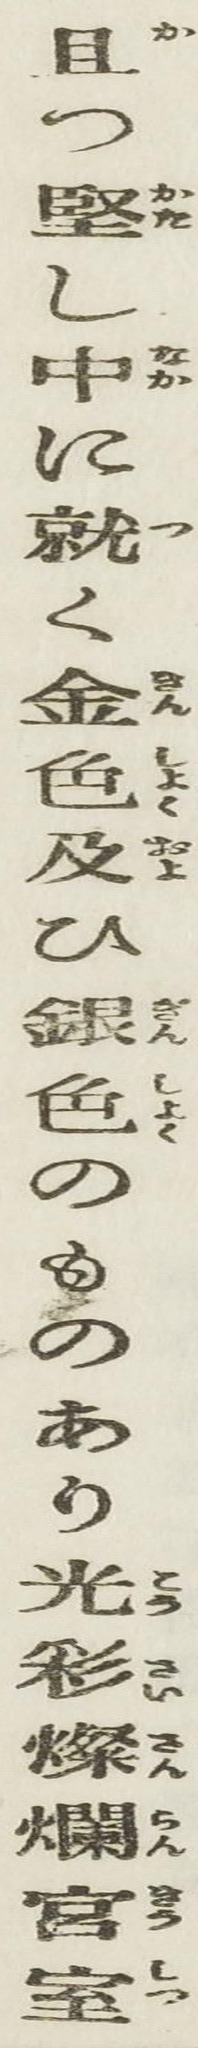且つ堅し中に就く金色及び銀色のものあり光彩燦爛宮室
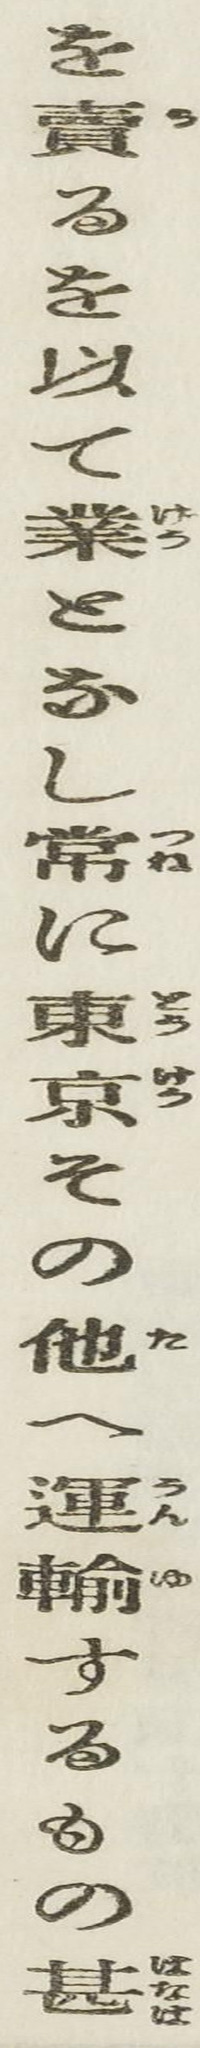を売るを以て業となし常に東京その他へ運輸するもの甚
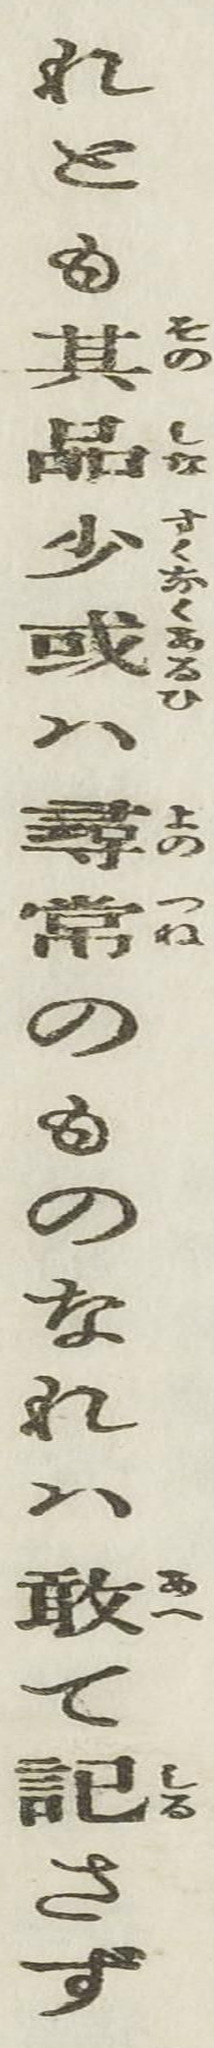れとも其品少或は尋常のものなれは敢て記さず

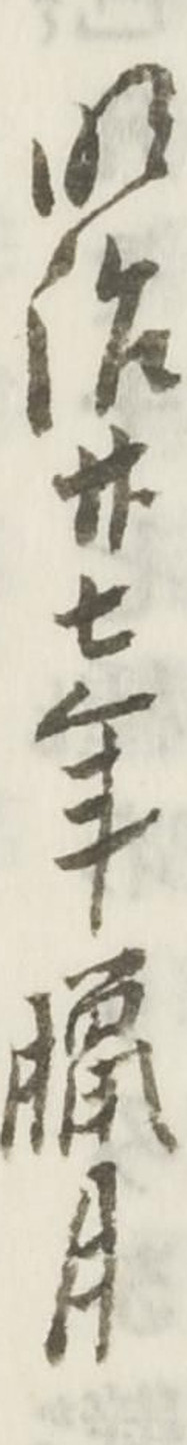明治廿七年臘月
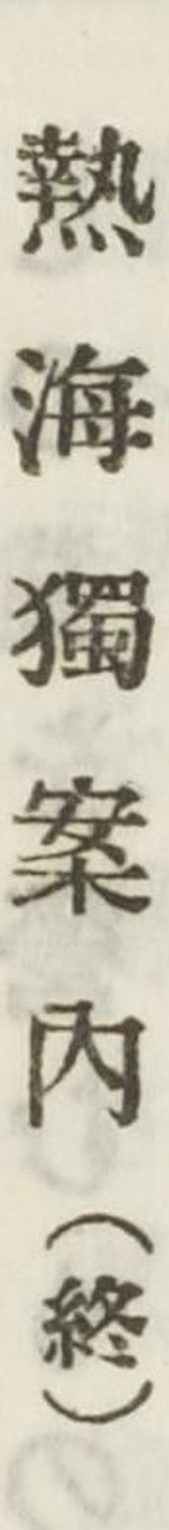熱海獨案内
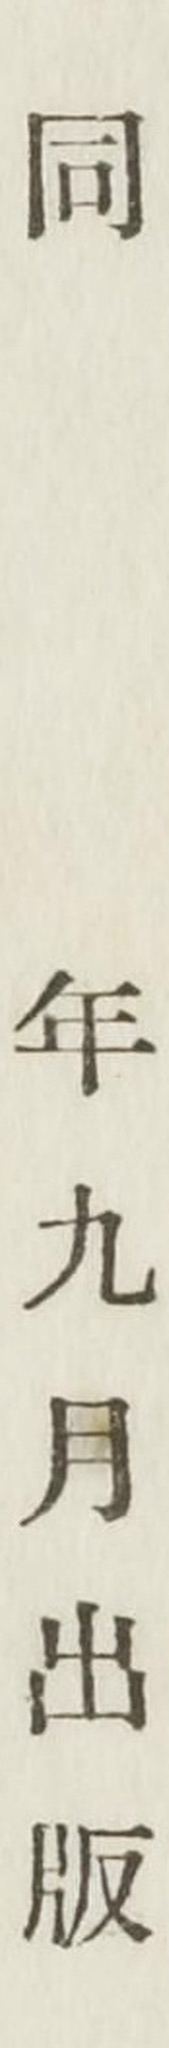同年九月出版
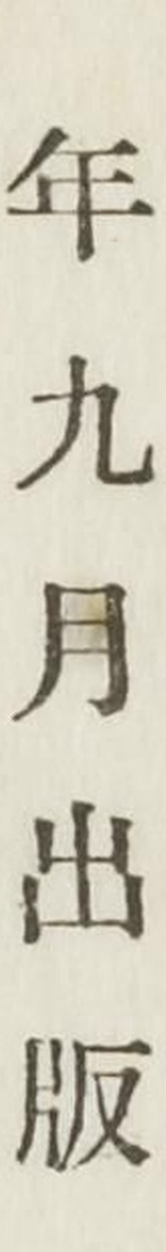同年九月出版
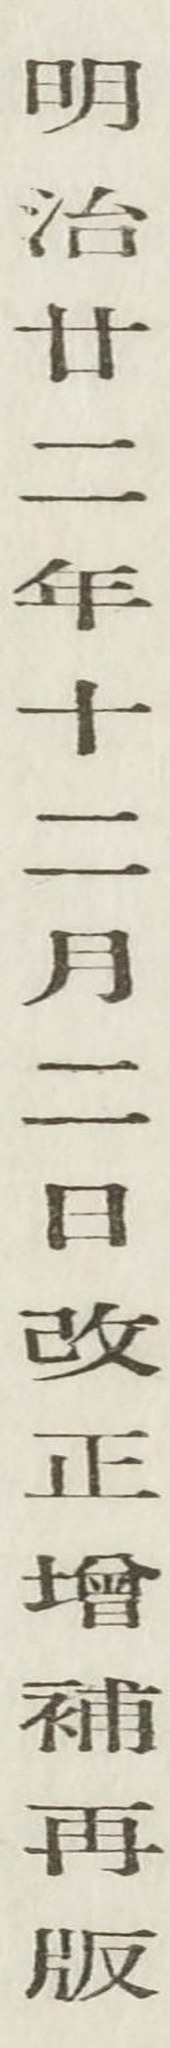明治廿二年十二月二日改正増補再版
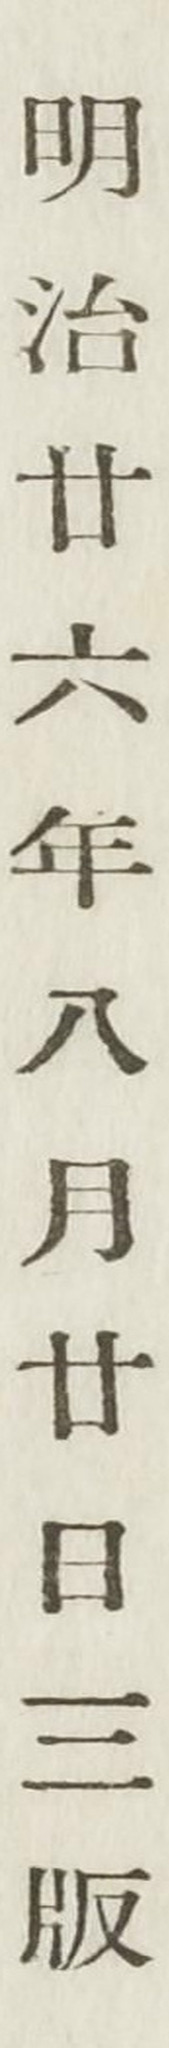明治廿六年八月廿日三版
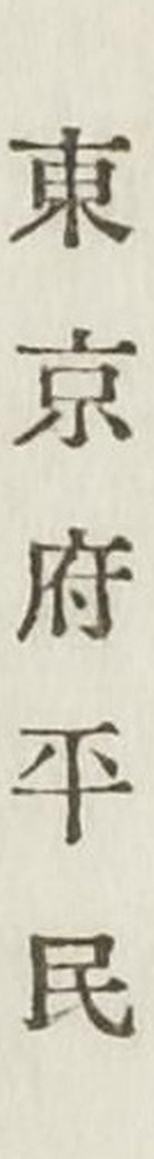東京府平民
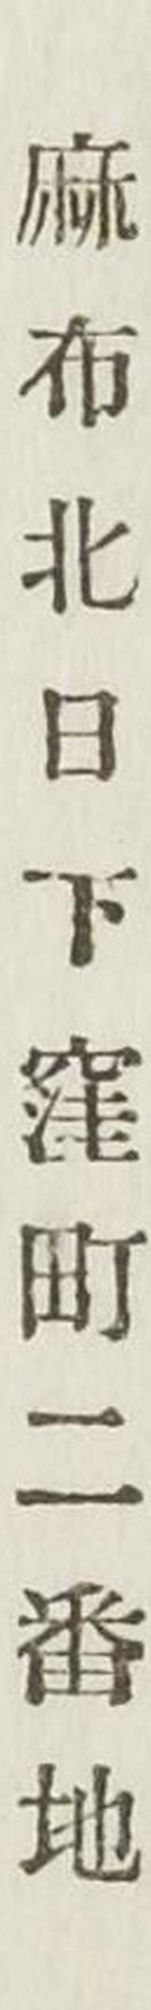麻布北日下窪町二番地
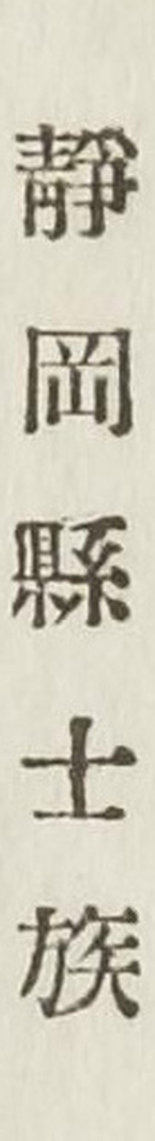静岡県士族
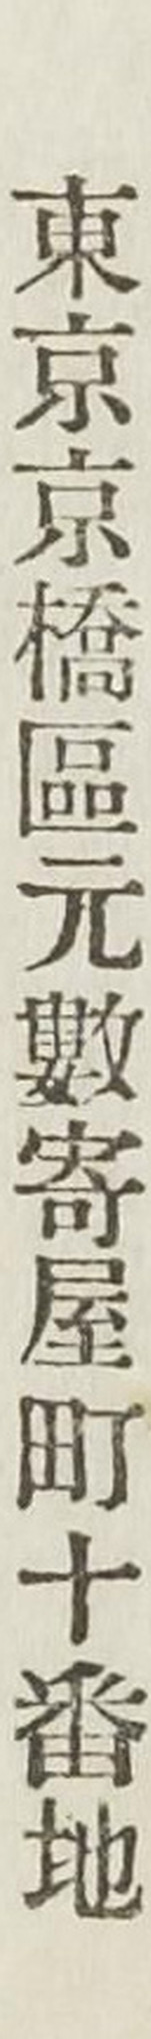東京京橋区元数寄屋町十番地
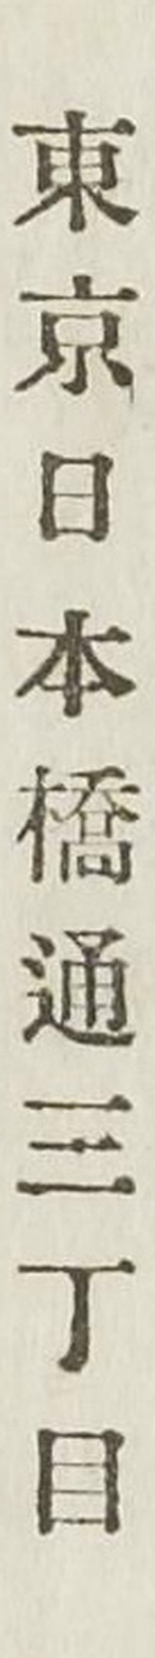東京日本橋通三丁目
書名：熱海獨案内　全
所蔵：東京大学地震研究所図書室 Earthquake Research Institute Library, The University of Tokyo, JAPAN
